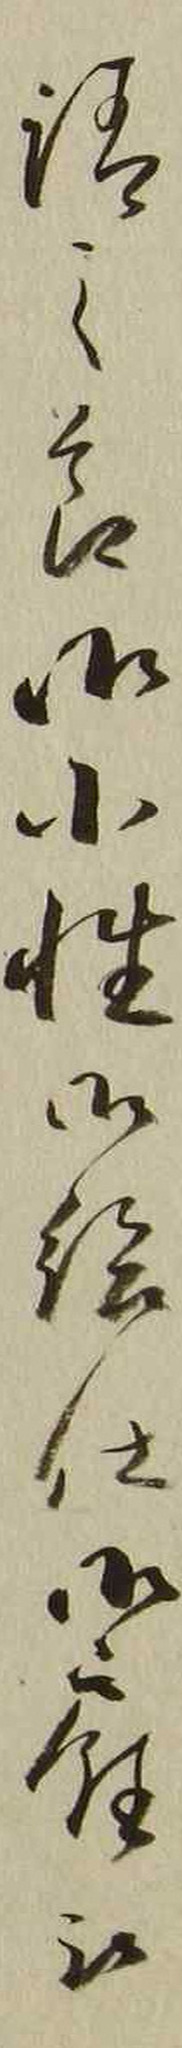請之節御小姓御給仕御雇被
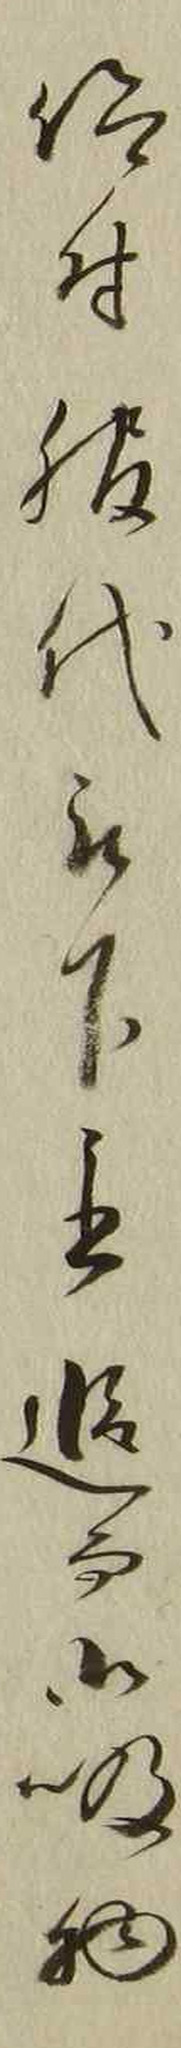仰付服代被下置追而御吸物
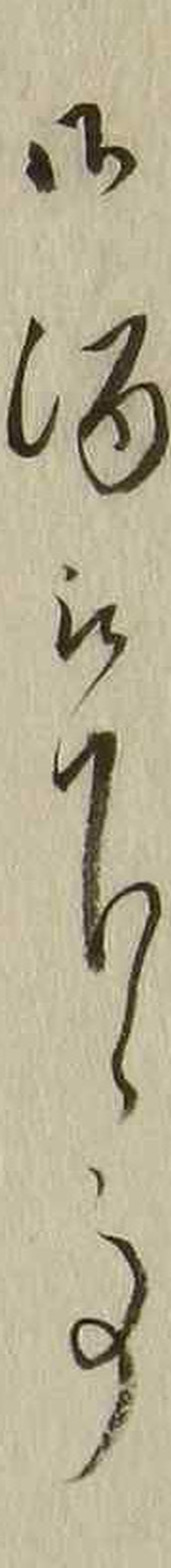御酒被下候事
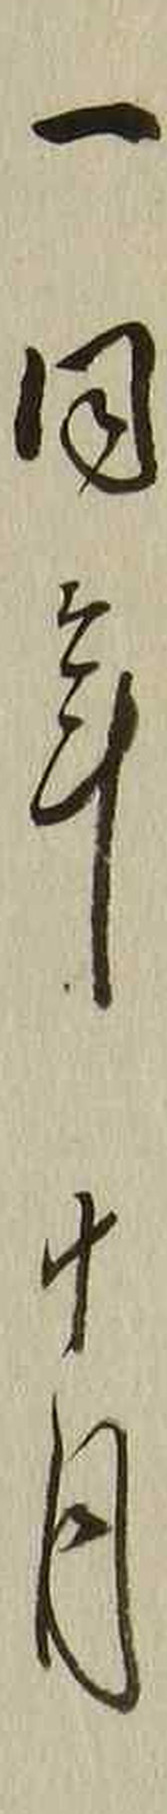一同年十月
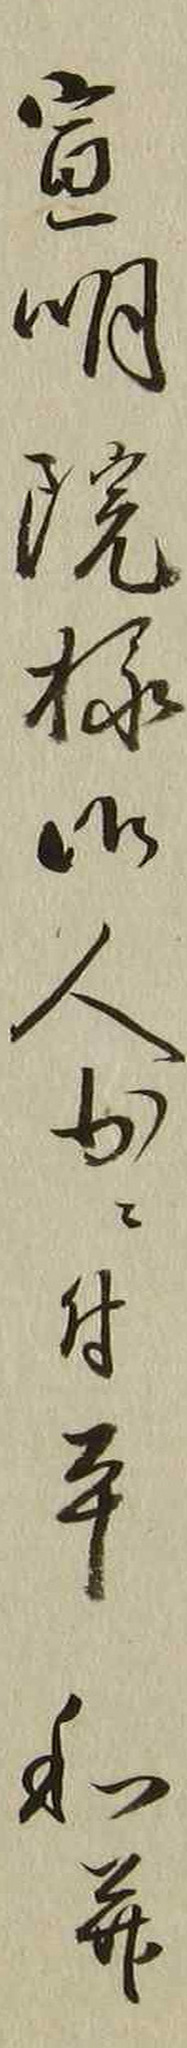宣明院様御人少ニ付平和幷
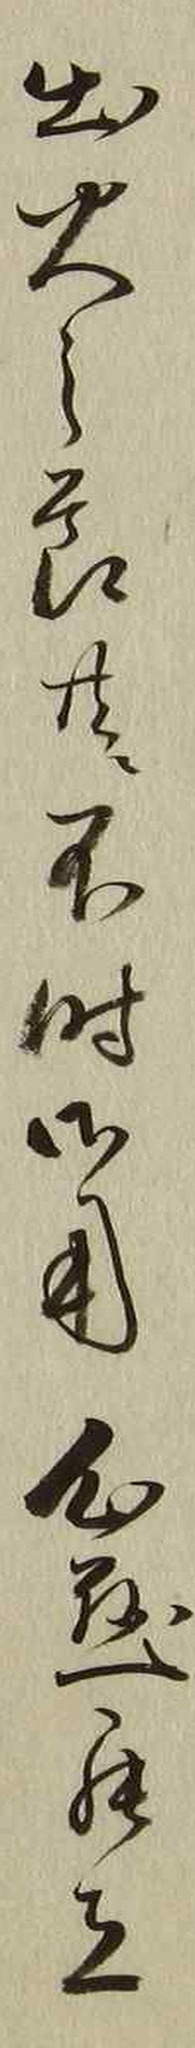出火之節共ニ不時御用心懸罷在
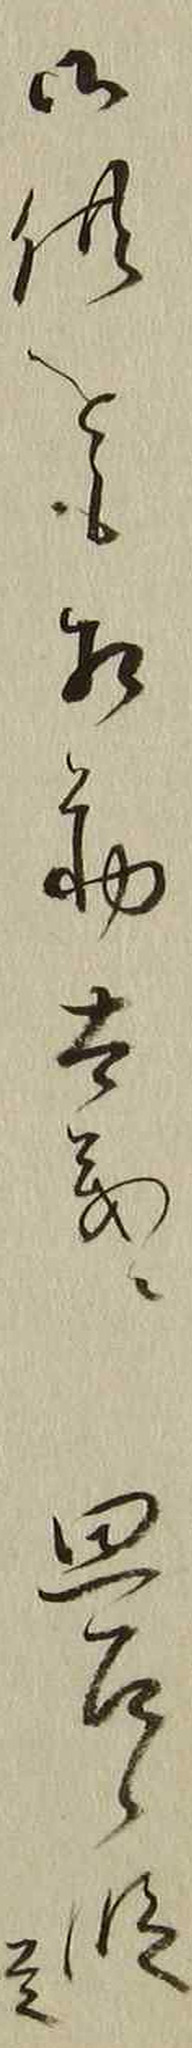御供をも相勤太義ニ思召候段従
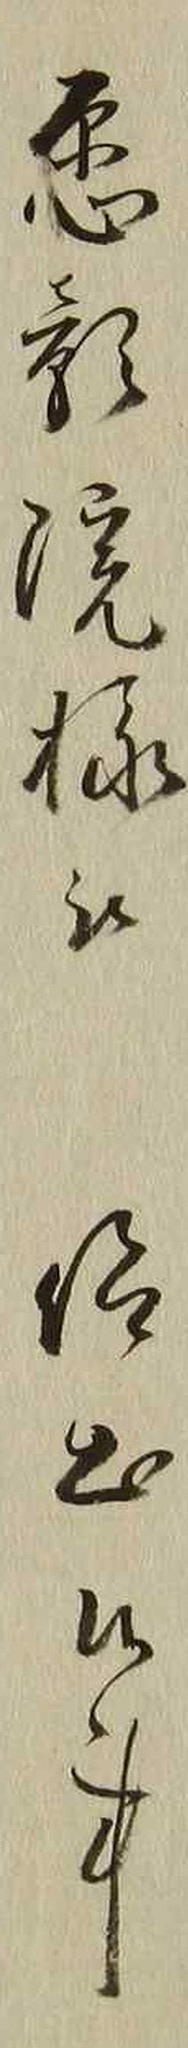愿彰院様被仰出候事
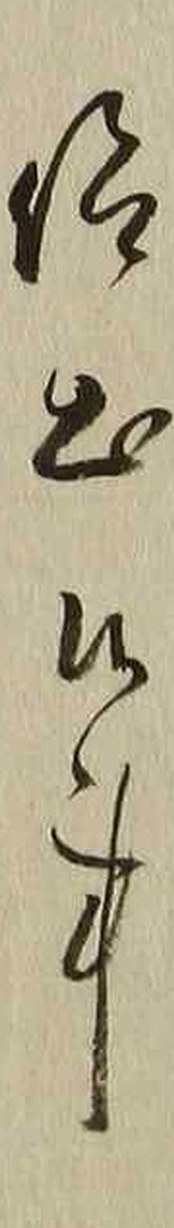仰出候事
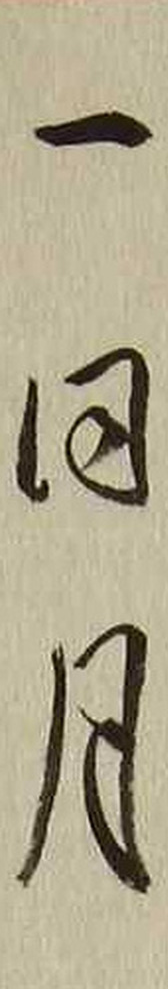一同月
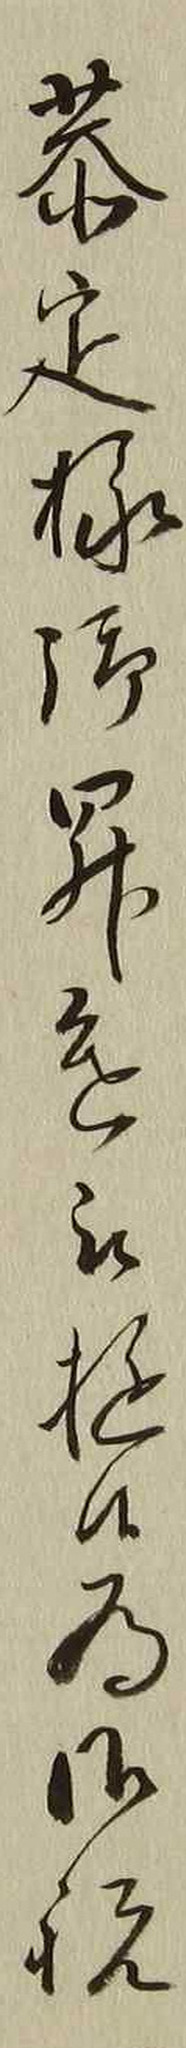恭定様御昇進被遊候為御祝
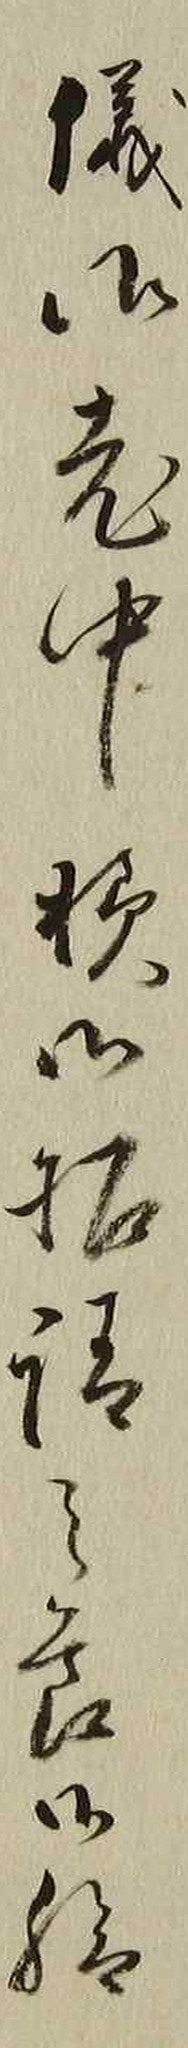儀御老中様御招請之節御給
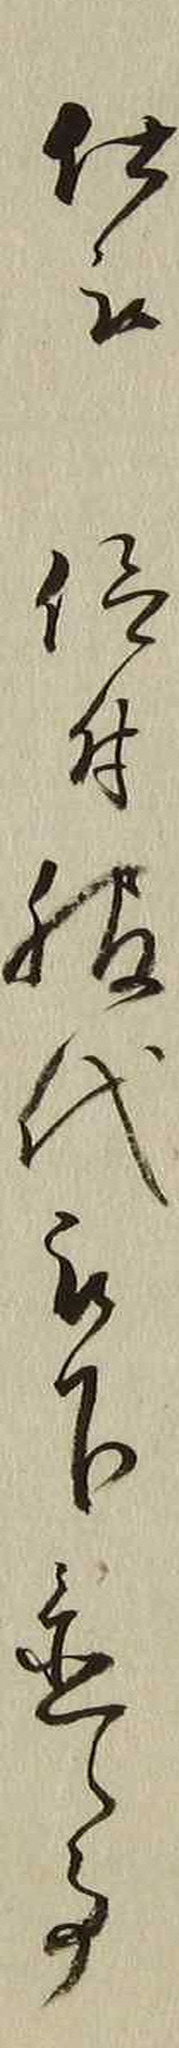仕被仰付服代被下置候事
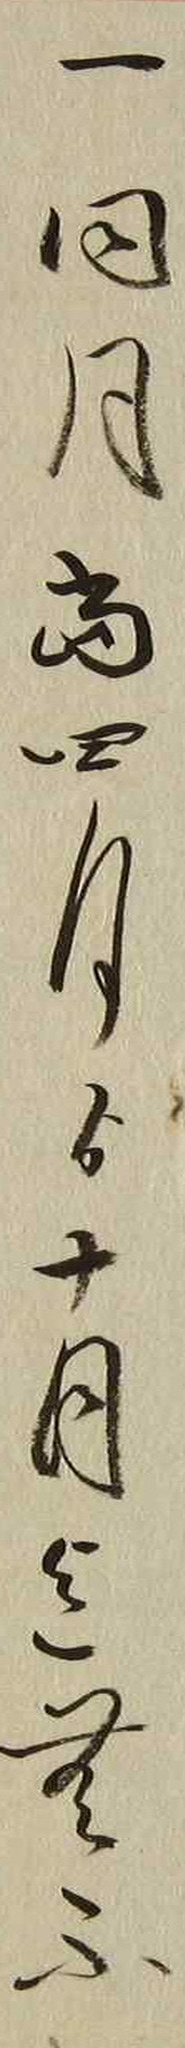一同月当四月ゟ十月迄無不
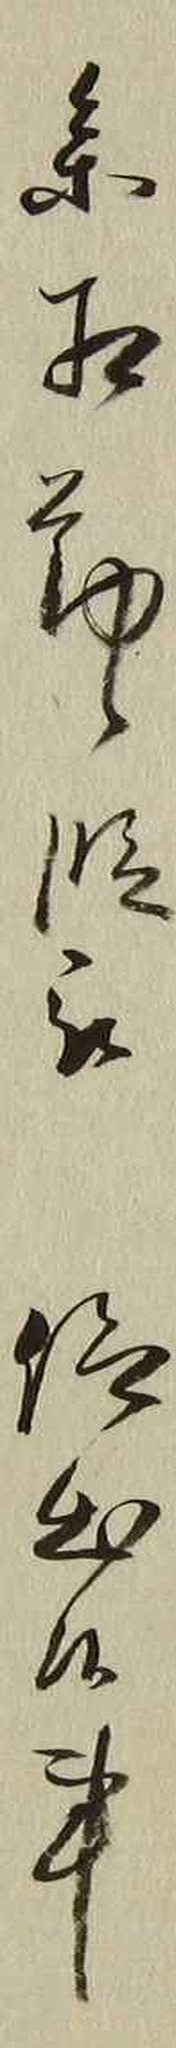参相勤候段被仰出候事
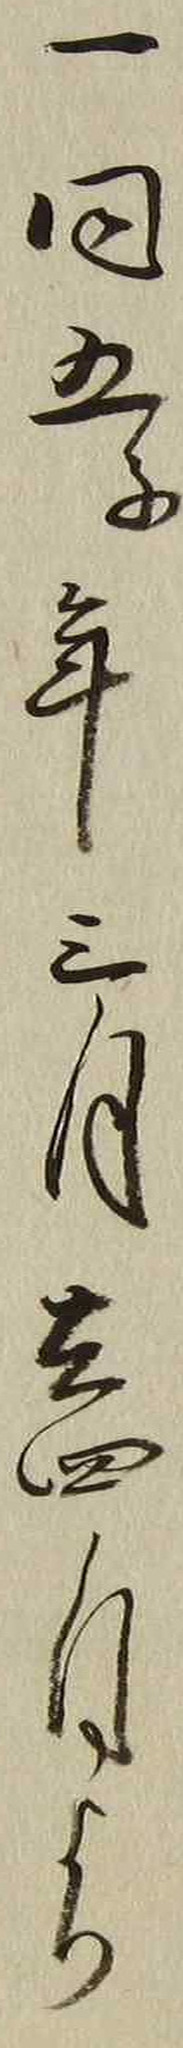一同五子年三月去四月より
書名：諸士系譜　巻之70　を之部4
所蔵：会津若松市立会津図書館
